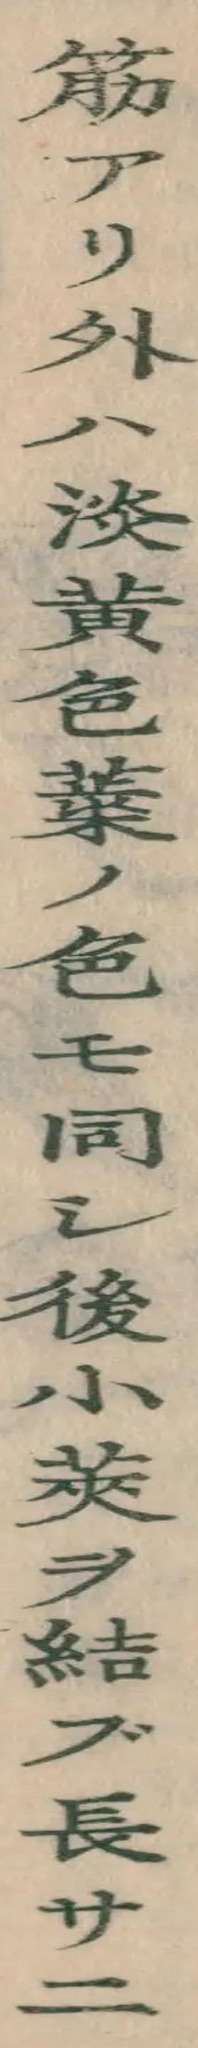筋アリ外ハ淡黄色蕊ノ色モ同シ後小莢ヲ結ブ長サ二
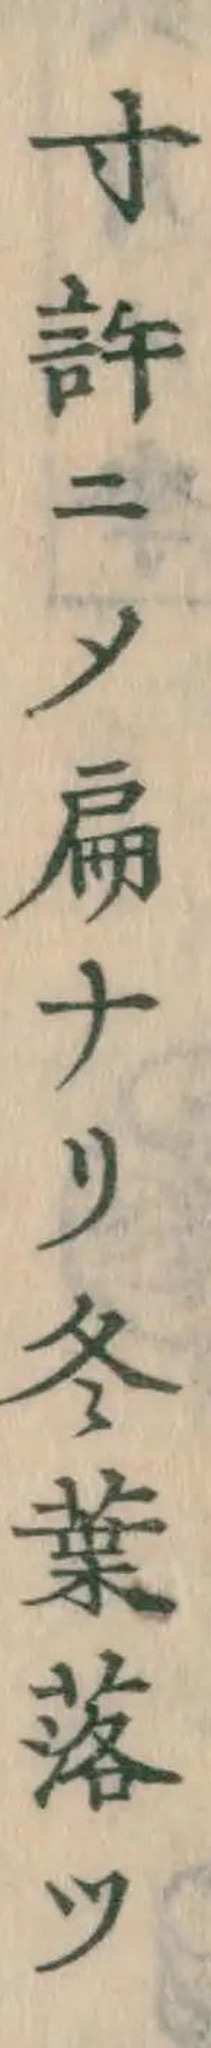寸許ニシテ扁ナリ冬葉落ツ
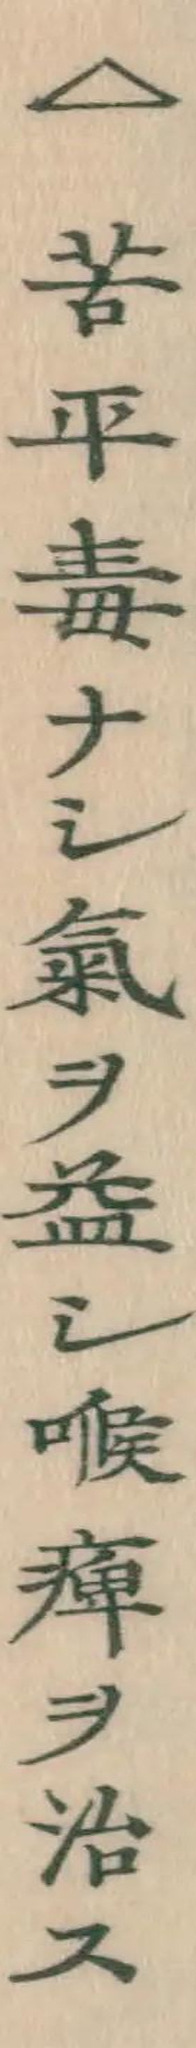△苦平毒ナシ気ヲ益シ喉痺ヲ治ス
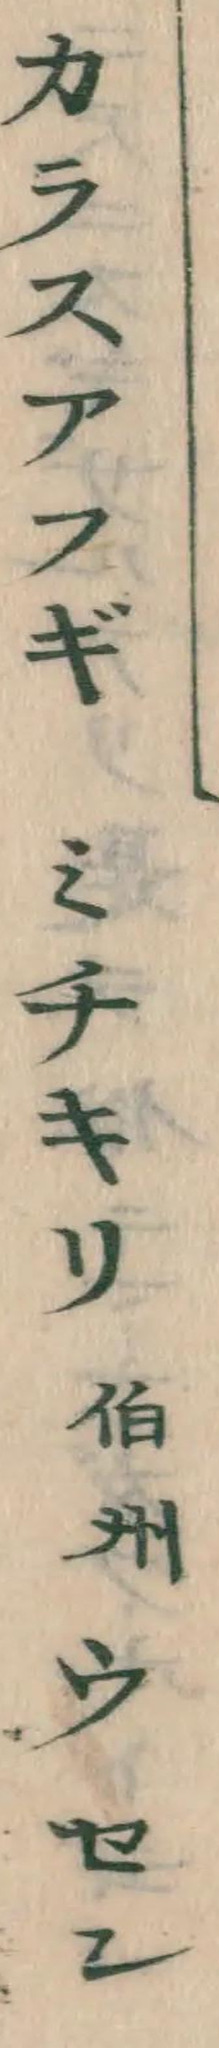カラスアフギミチキリ伯州ウセン

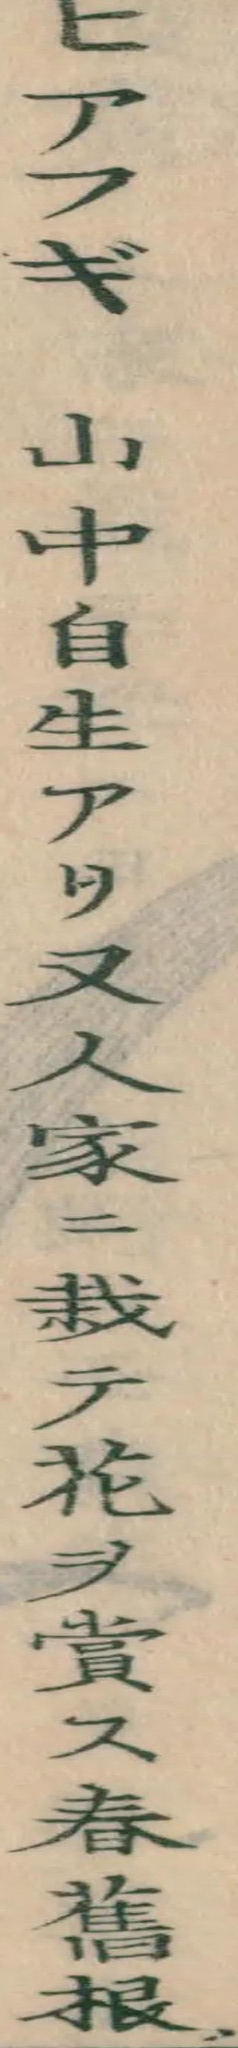ヒアフギ山中自生アリ又人家ニ栽テ花ヲ賞ス春旧根
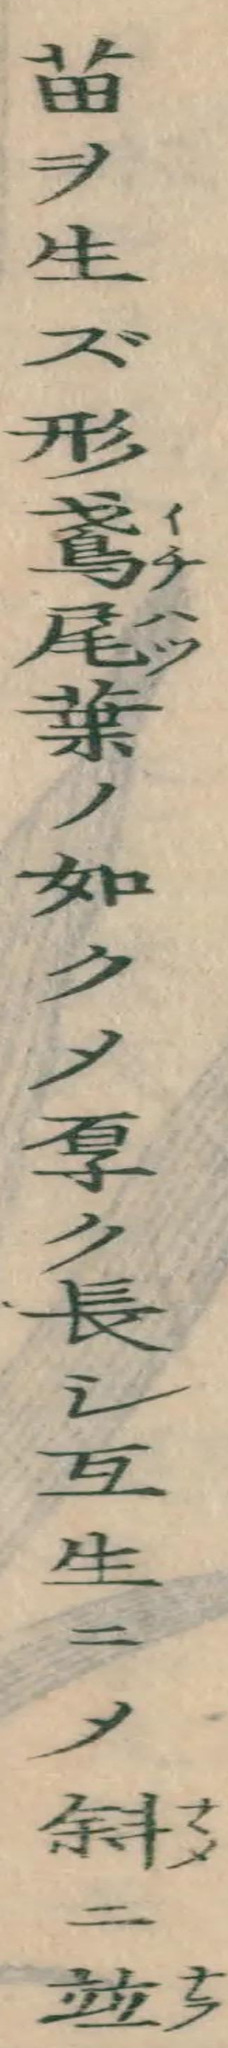苗ヲ生ズ形鳶尾葉ノ如クシテ厚ク長シ互生ニシテ斜ニ並
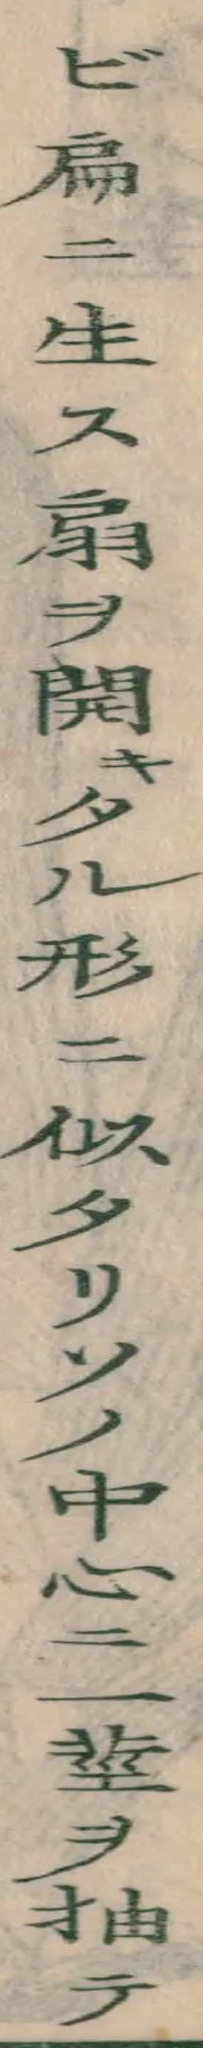ビ扁ニ生ス扇ヲ開タル形ニ似タリソノ中心ニ一茎ヲ抽テ
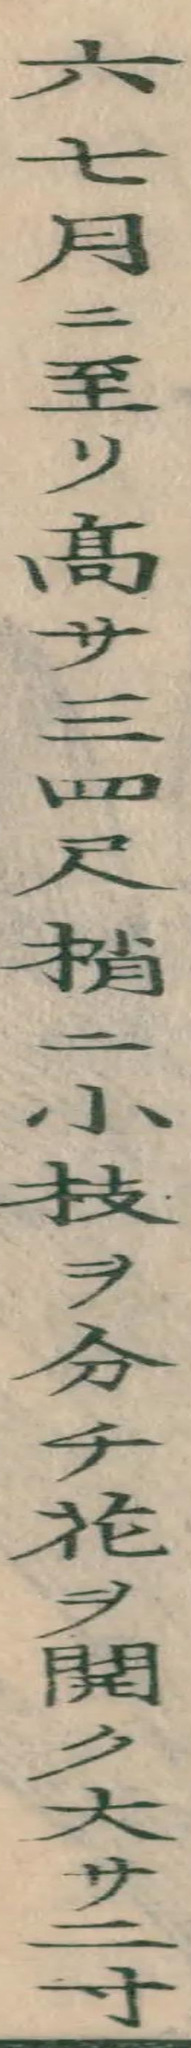六七月ニ至リ高サ三四尺梢ニ小枝ヲ分チ花ヲ開ク大サ二寸
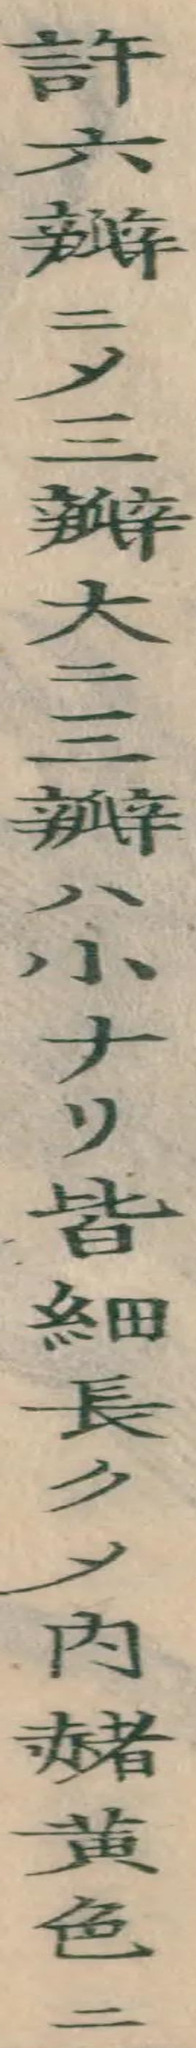許六弁ニシテ三弁大ニ三弁ハ小ナリ皆細長クシテ内赭黄色ニ
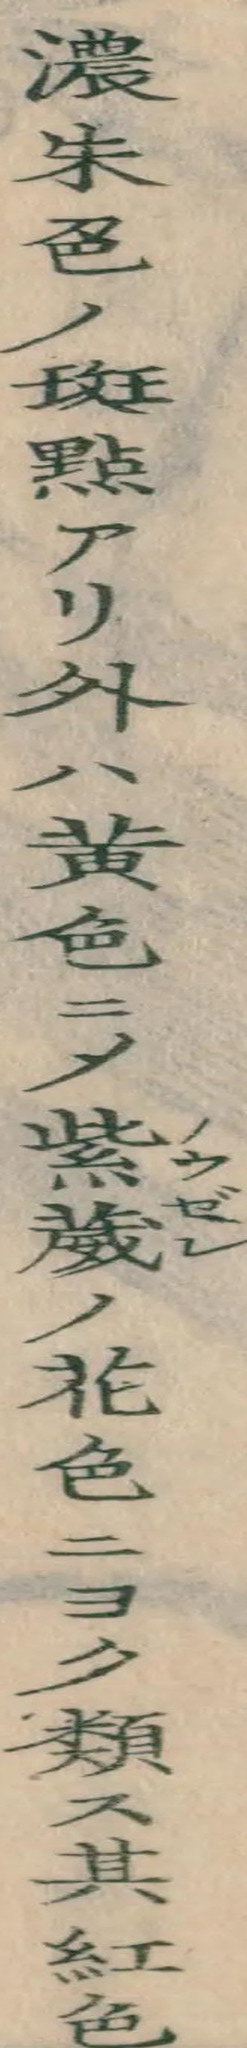濃朱色ノ斑点アリ外ハ黄色ニシテ紫葳ノ花色ニヨク類ス其紅色
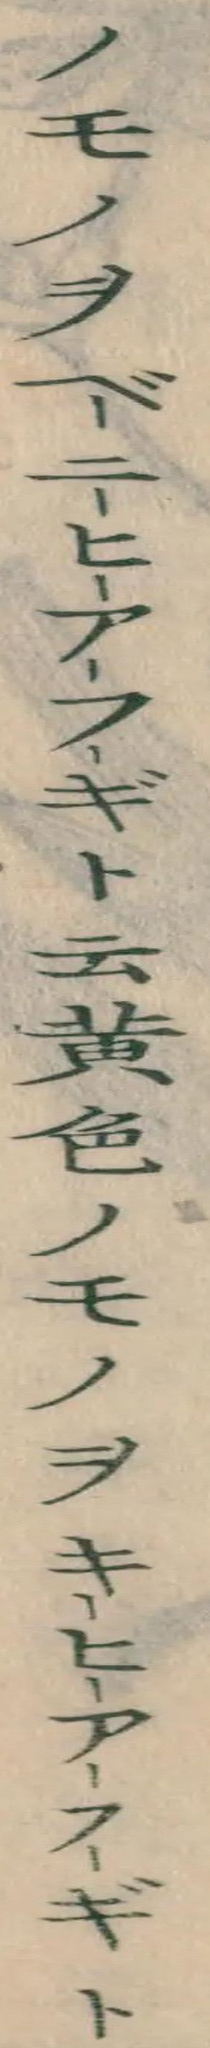ノモノヲベ-ニ-ヒ-ア-フ-ギト云黄色ノモノヲキ-ヒ-ア-フ-ギト
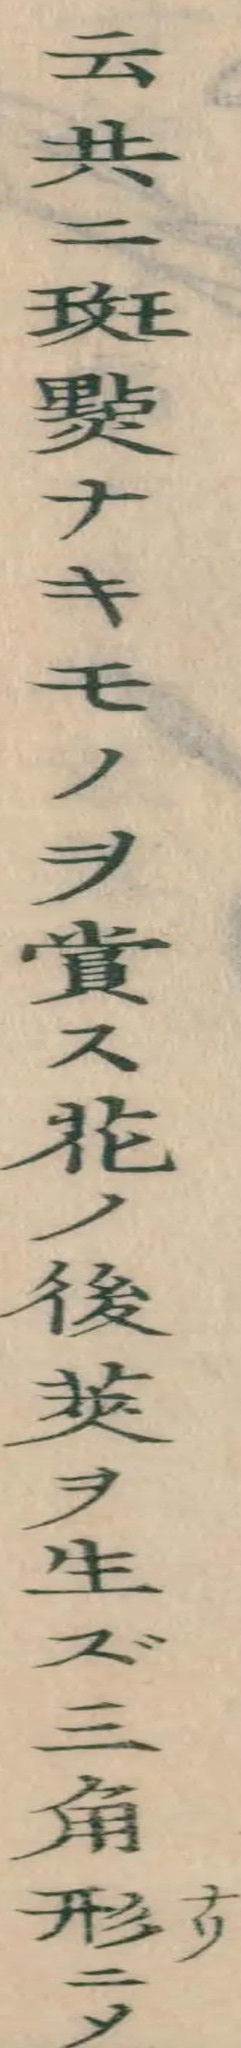云共ニ斑点ナキモノヲ賞ス花ノ後莢ヲ生ズ三角形ニシテ
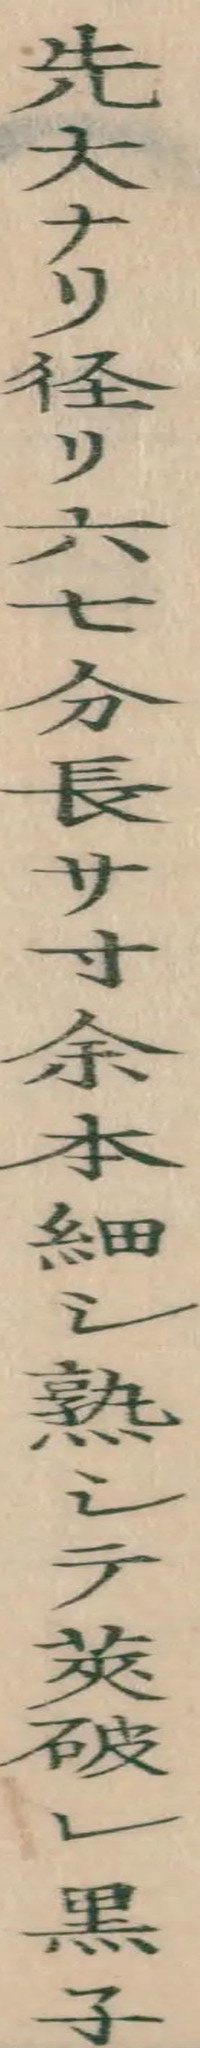先大ナリ径リ六七分長サ寸余本細シ熟シテ莢破レ黒子
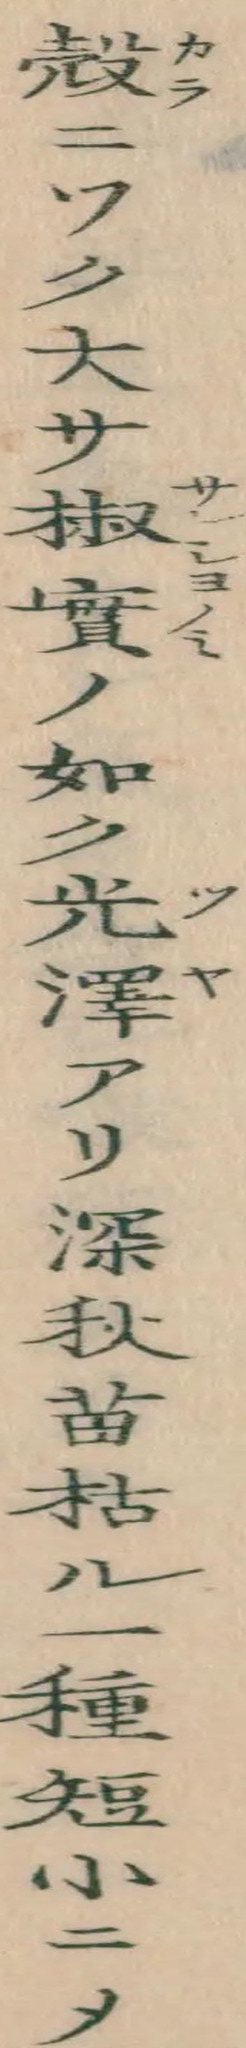殻ニツク大サ椒実ノ如ク光沢アリ深秋苗枯ル一種短小ニシテ
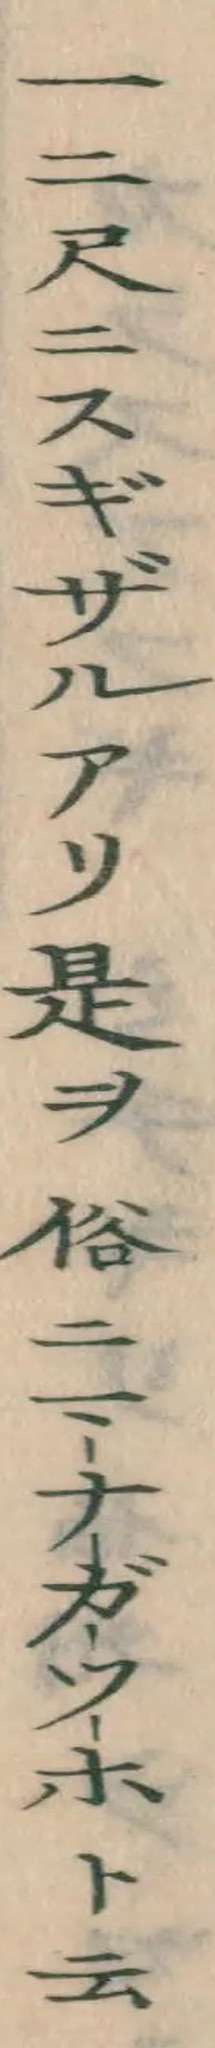一二尺ニスギザルアリ是ヲ俗ニマ-ナ-ガ-ツ-ホト云
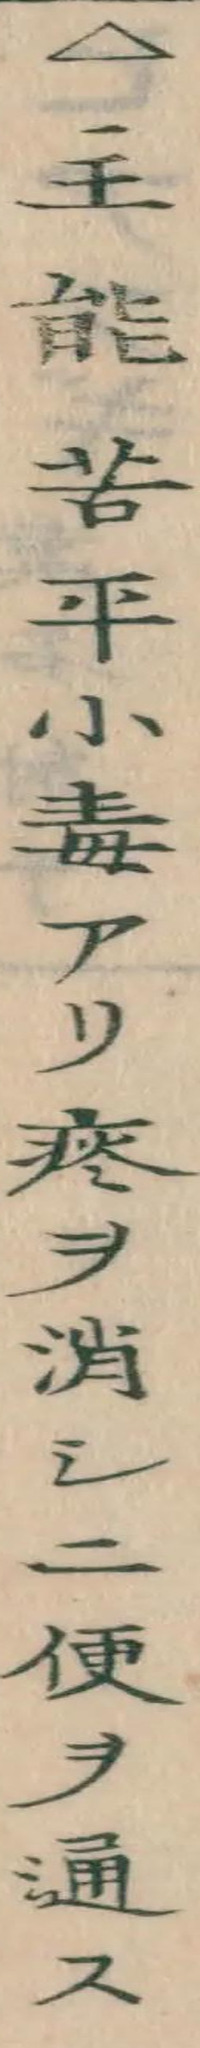△主能苦平小毒アリ痰ヲ消シ二便ヲ通ス
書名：これこれ草 2巻. [2]
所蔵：国立国会図書館 National Diet Library, JAPAN
